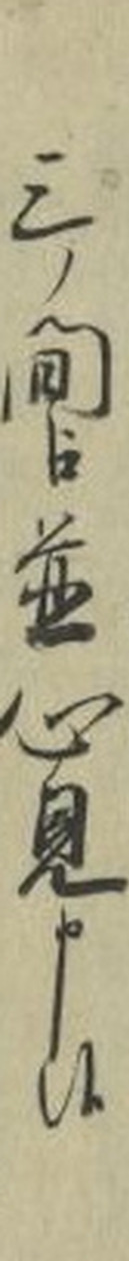三の間え並心見申候
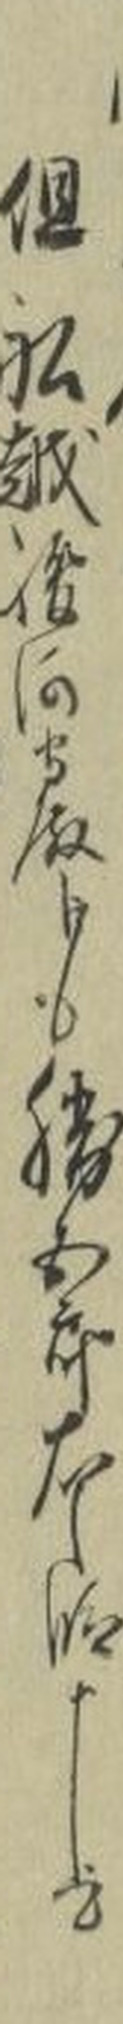但船越駿河守殿えも勝五郎右之段申上候
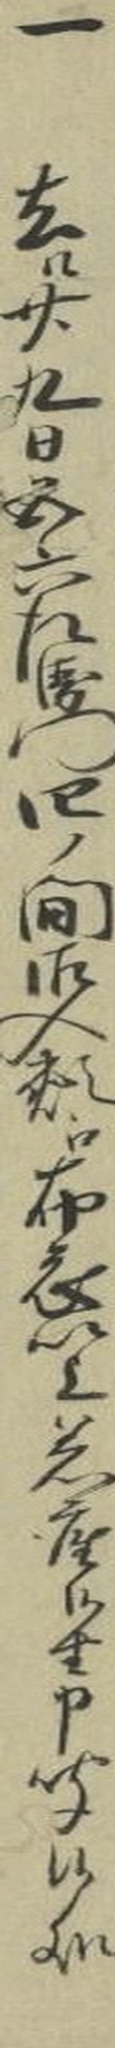一去る廿九日五六左衛門四の間御入頬え布衣以上着座候由申聞候処
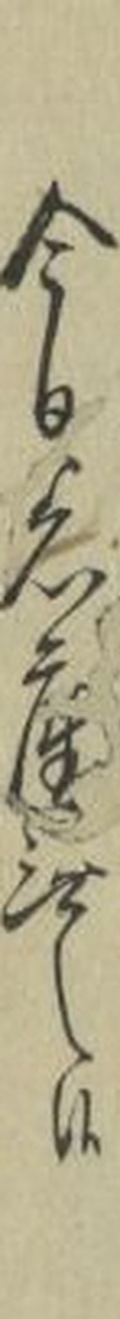今日着座無之候
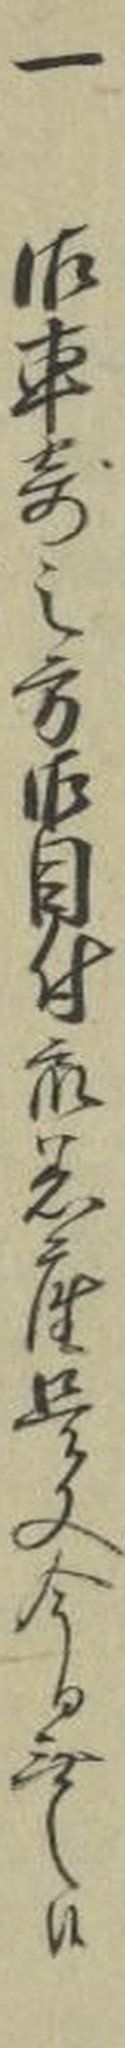一御車寄之方御目付衆着座是又今日無之候
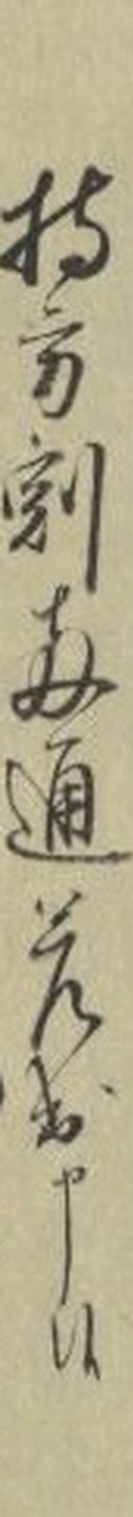一持方割両通差出申候
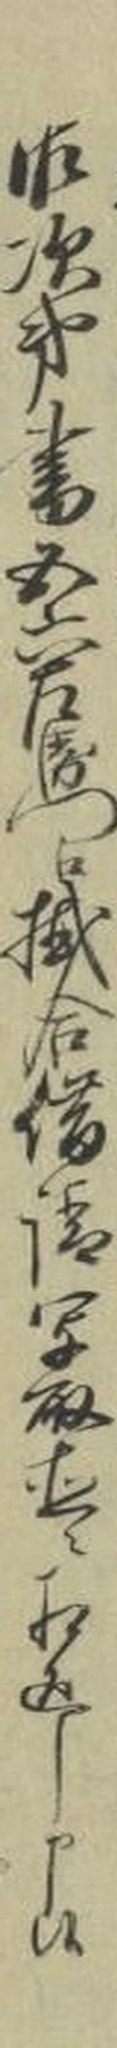一御次第書五六左衛門え掛合借請写取直に相返し申候
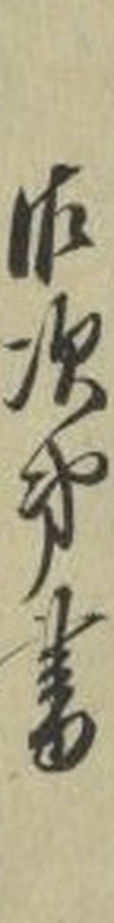御次第書
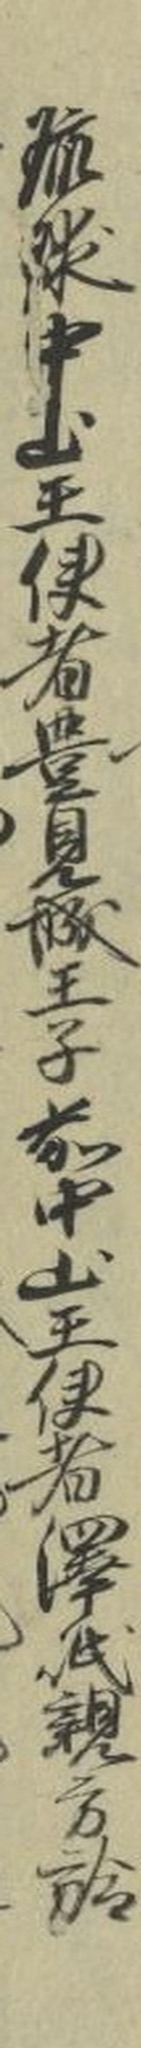琉球中山王使者豊見城王子前中山王使者沢岻親方於
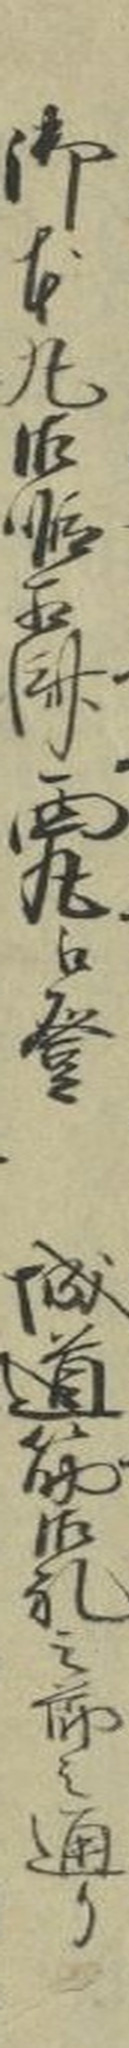御本丸御暇相済西丸え登城道筋御礼之節之通り
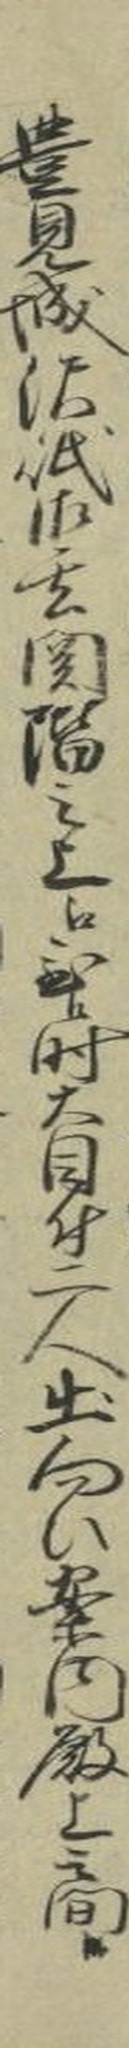一豊見城沢岻御玄関階之上え至候時大目付二人出向ひ案内殿上之間え
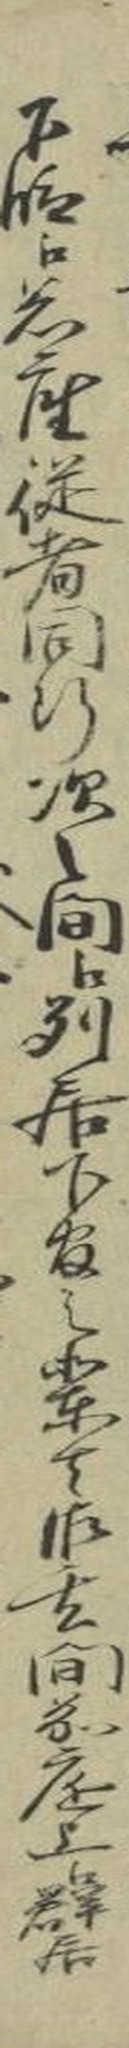下段え着座従者同行次之間え列居下官之輩は御玄関前庭上え群居
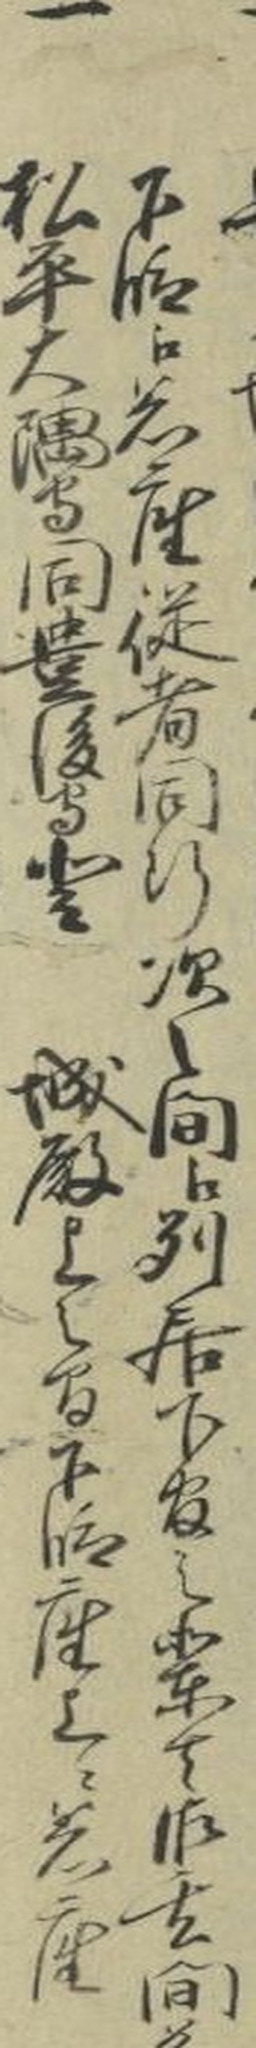一松平大隅守同豊後守登城殿上之間下段座上に着座
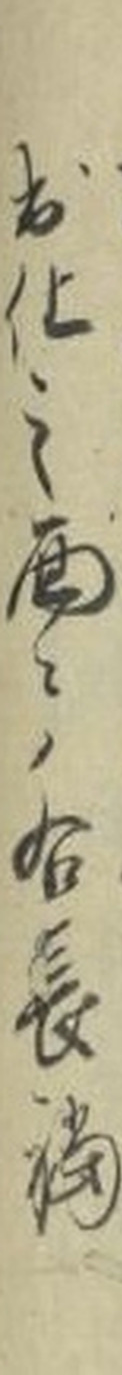一出仕之面々各長襠
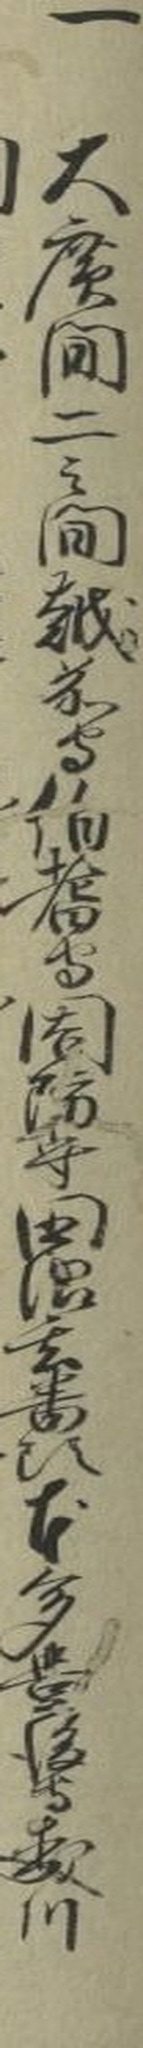一大広間二の間越前守伯耆守周防守田沼玄番頭本多豊後守森川
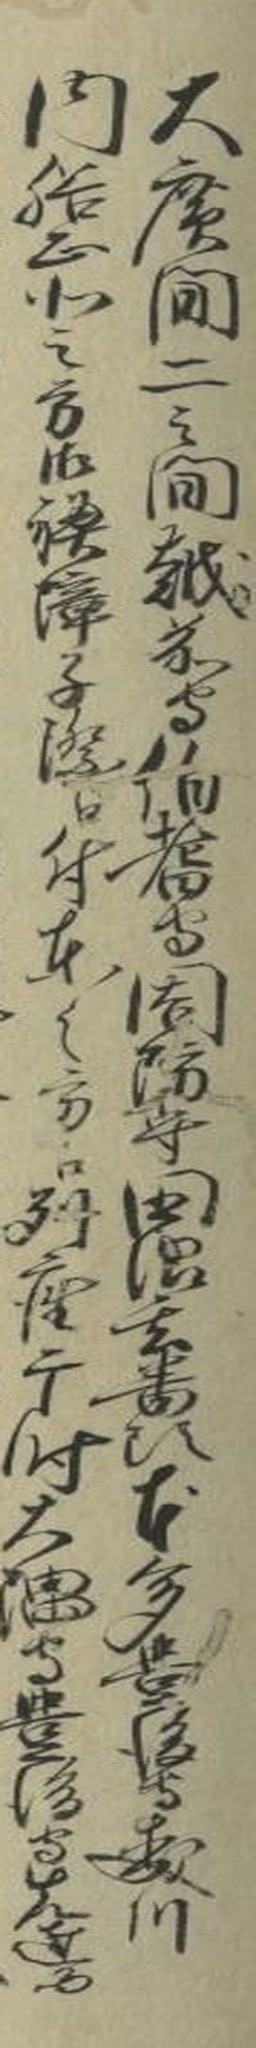内膳正北之方御襖障子際え付東之方え列座于時大隅守豊後守先達て
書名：天保三壬辰年琉球人参府之節勤方書留
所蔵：University of the Ryukyus Library
